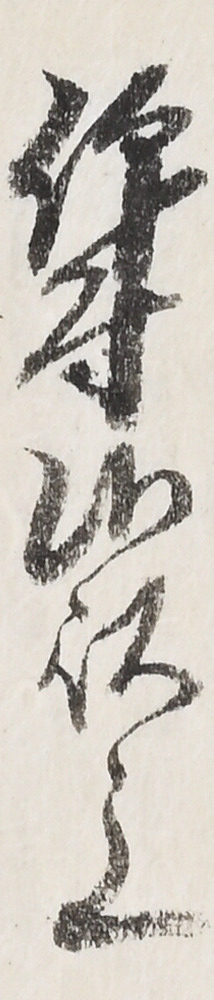仰付候以上
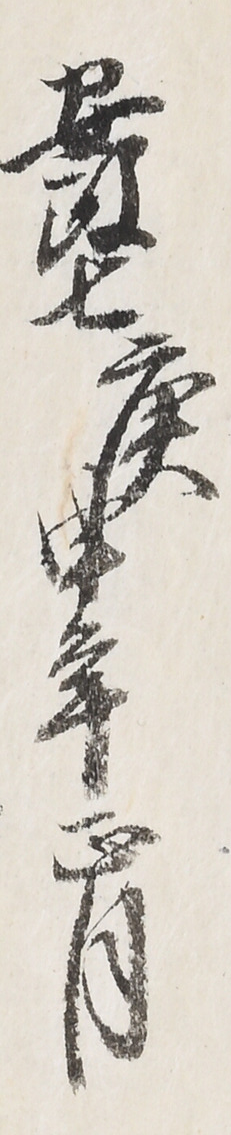安政七庚申年正月
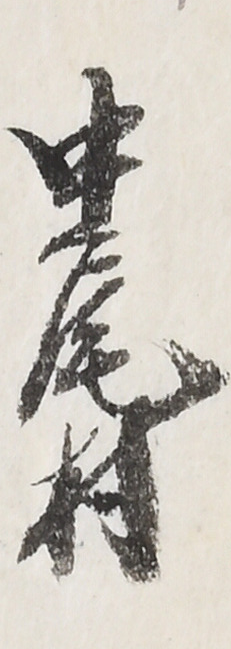中尾村
